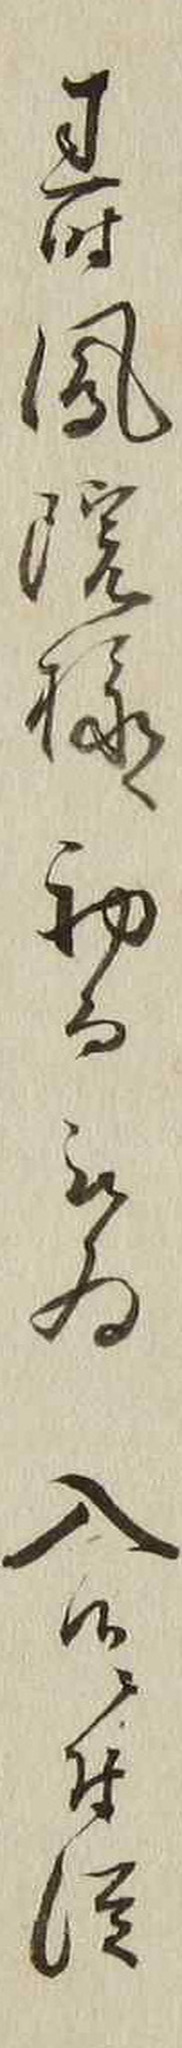寿鳳院様へ初而被為入候ニ付従
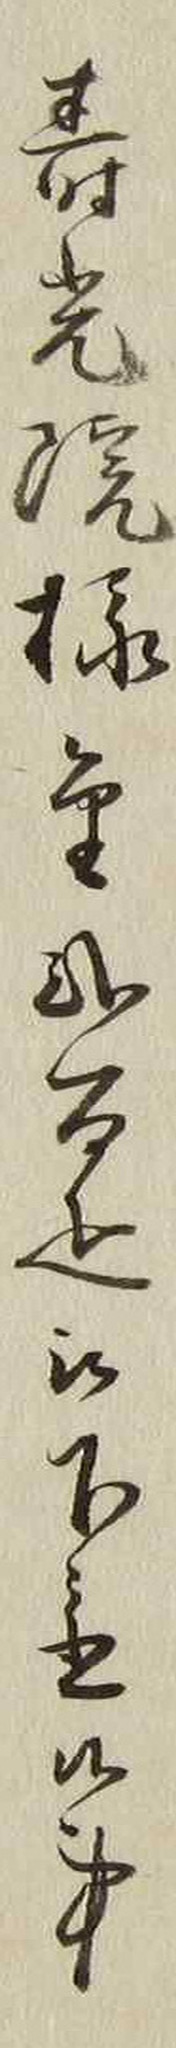寿光院様金弐百疋被下置候事
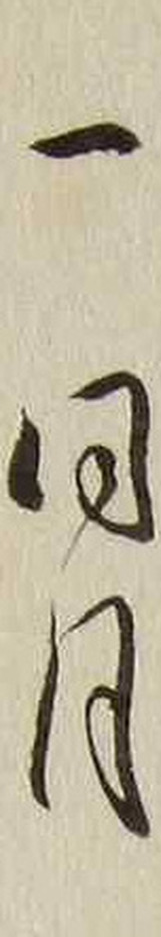一同月
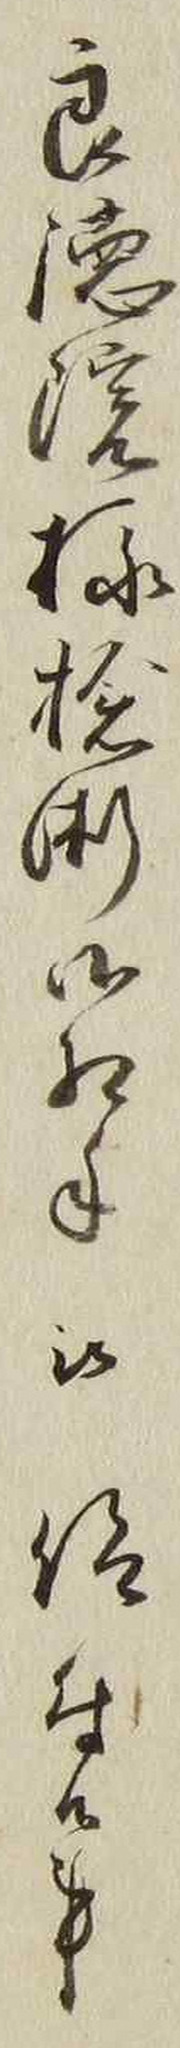良徳院様槍術御相手被仰付候事
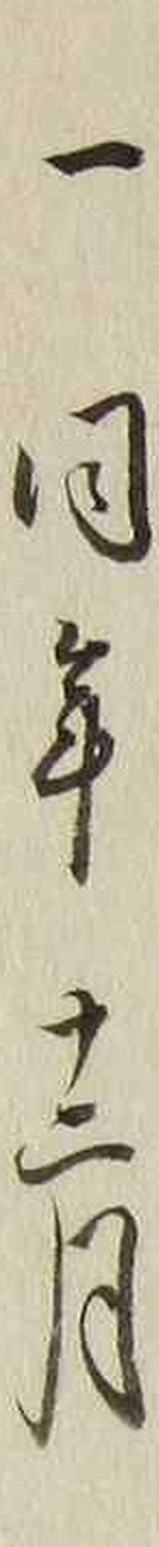一同年十二月
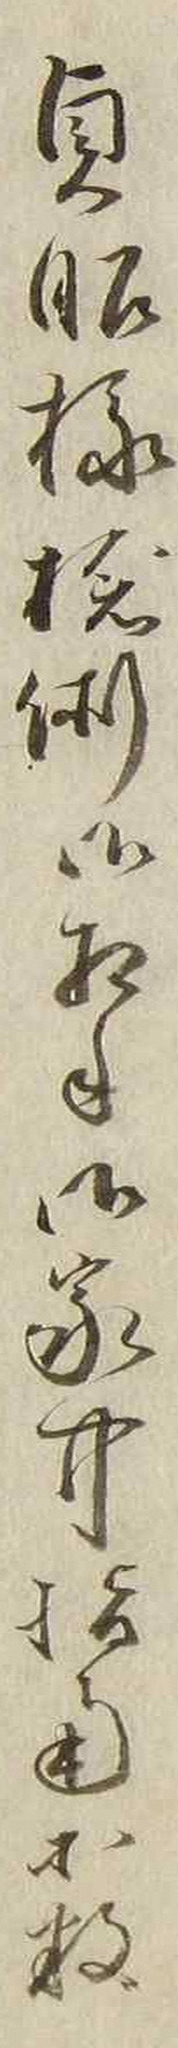貞昭様槍術御相手御家中指南等数

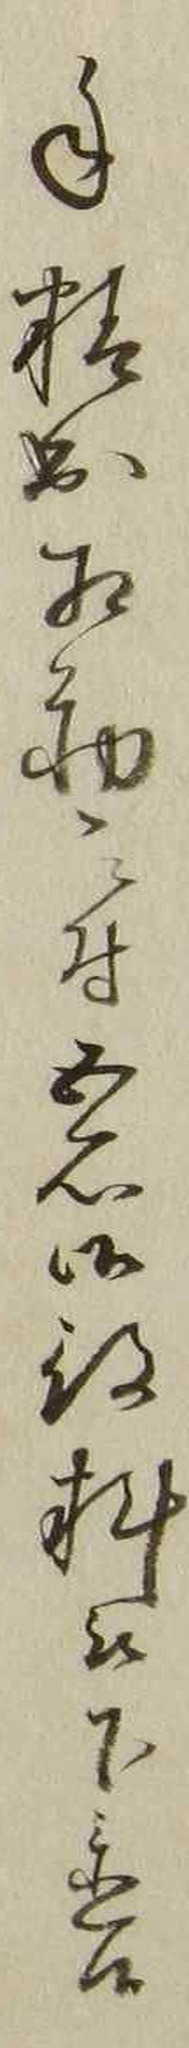年精出相勤候ニ付五石御役料被下置候
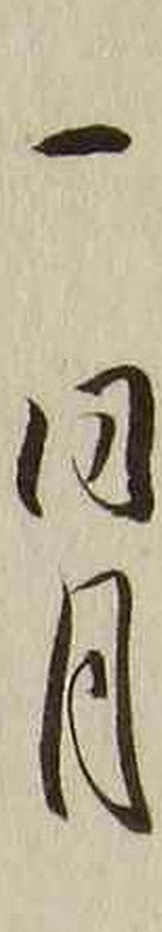一同月
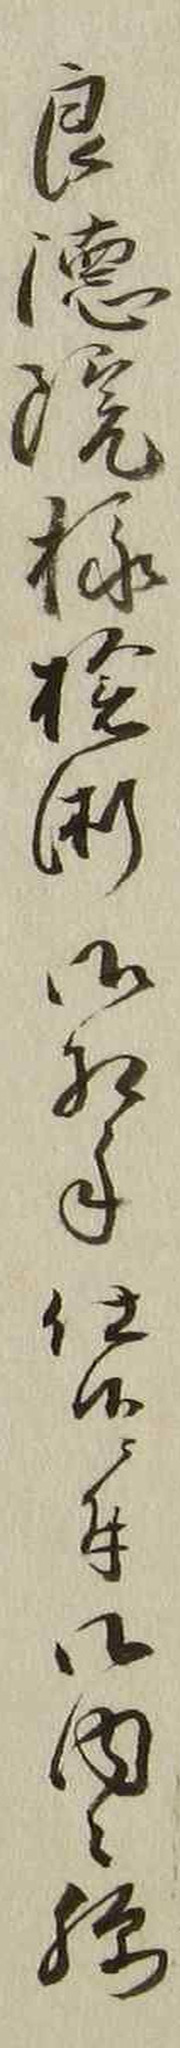良徳院様槍術御相手仕候ニ付御内々綿
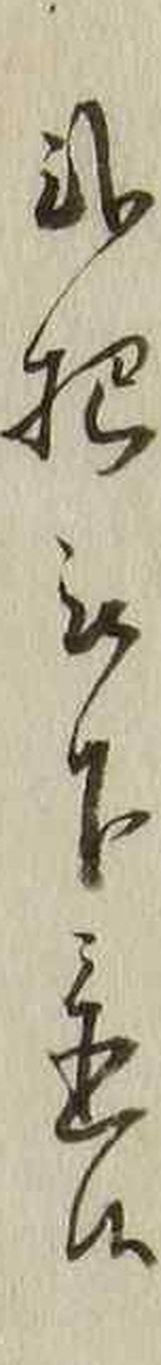弐把被下置候
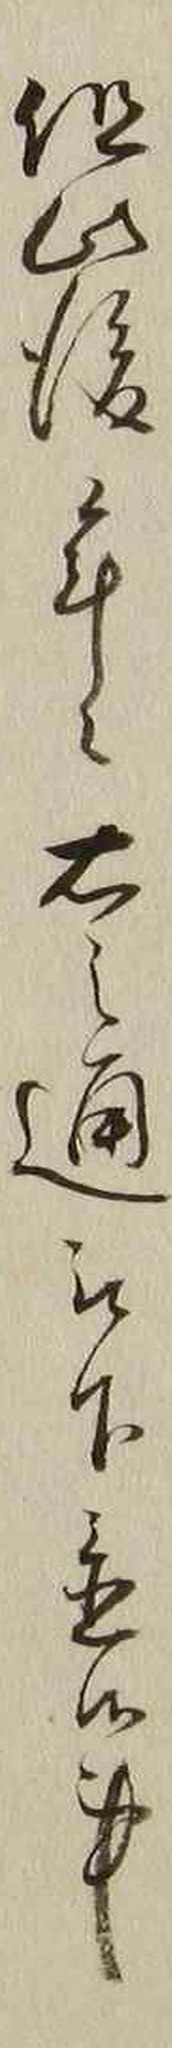但此後年々右之通被下置候事
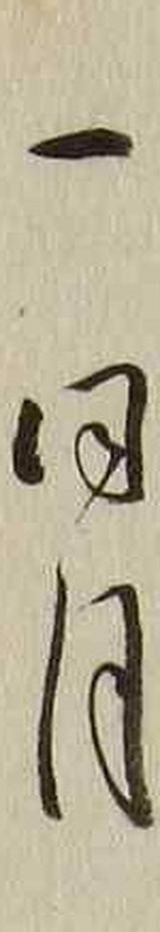一同月
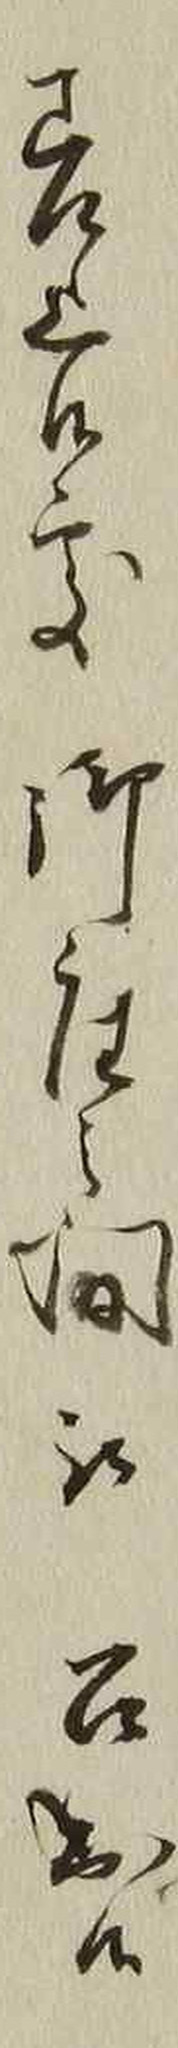差上候処御座之間被召出候
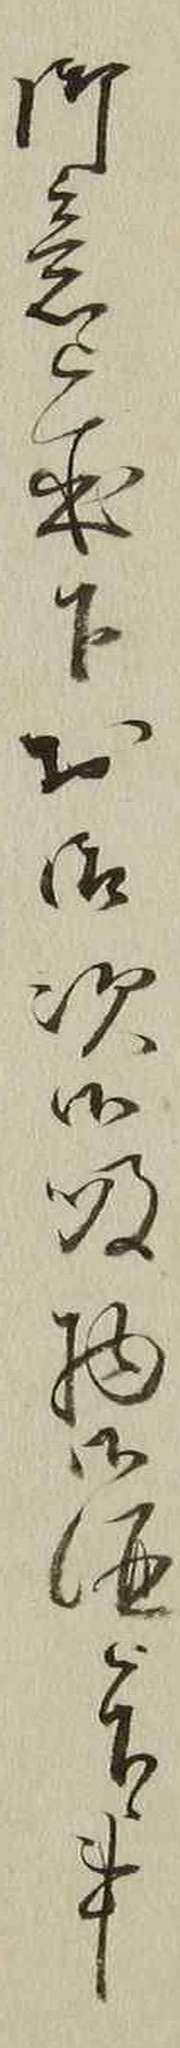御意被成下於御次御吸物御酒被下候事
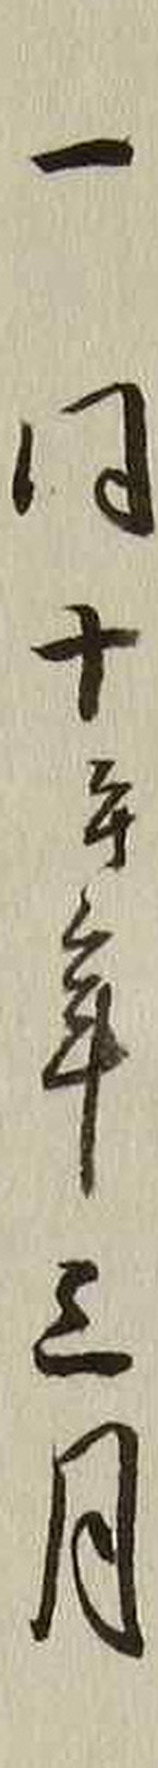一同十午年三月
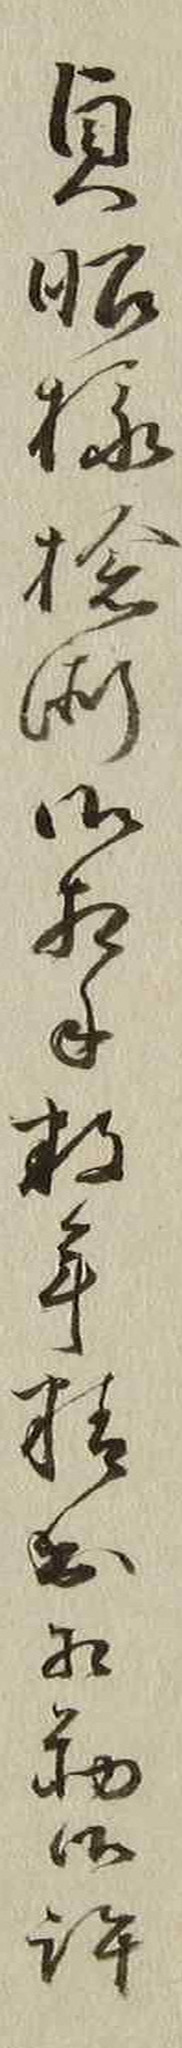貞昭様槍術御相手数年精出相勤御許
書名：諸士系譜　巻之28　い之部28
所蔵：会津若松市立会津図書館
